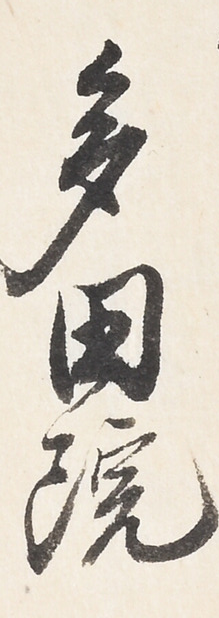多田院

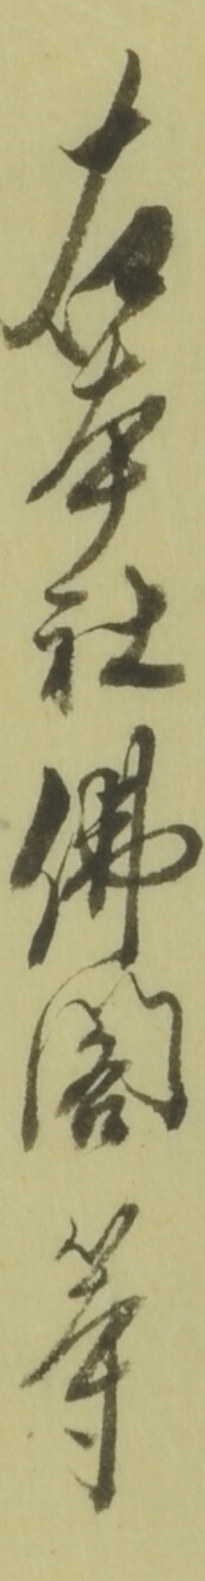右本社仏閣等
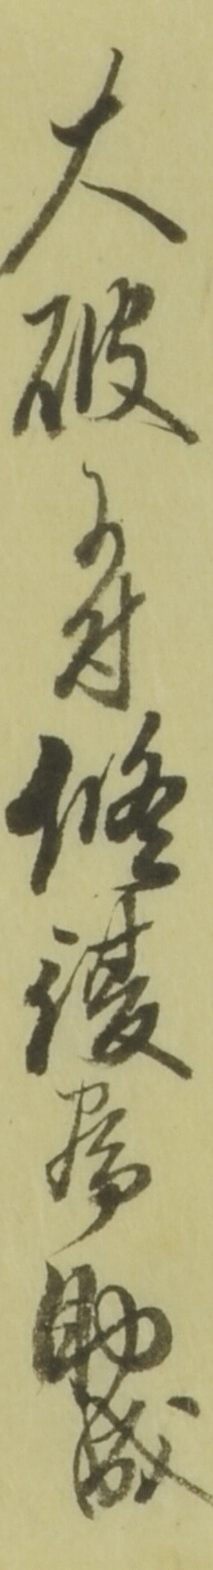大破に付修復為助成
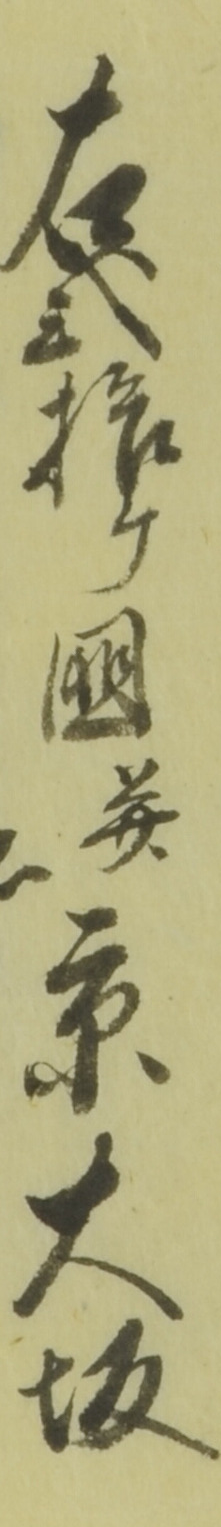右弐拾ヶ国并京大坂
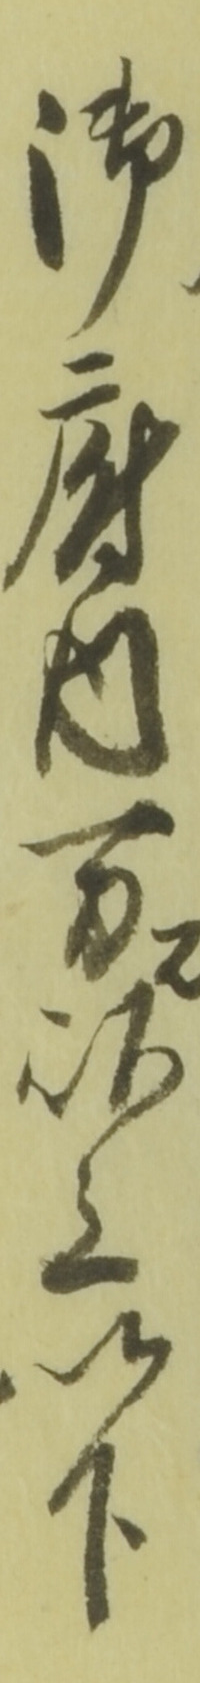御府万石以上以下

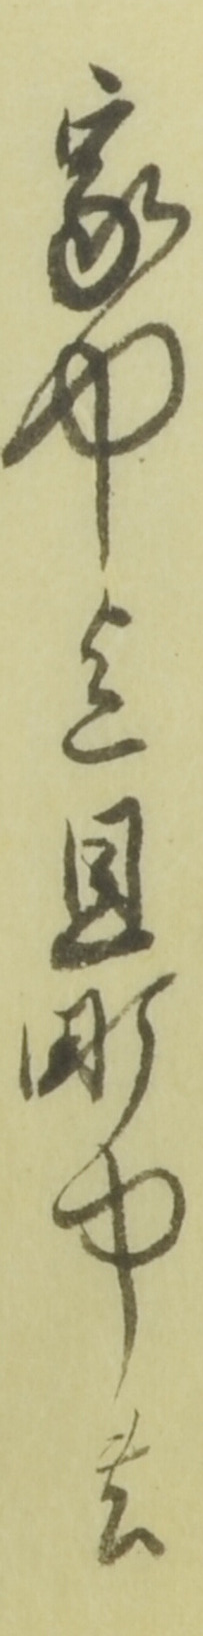家中迄且町中共
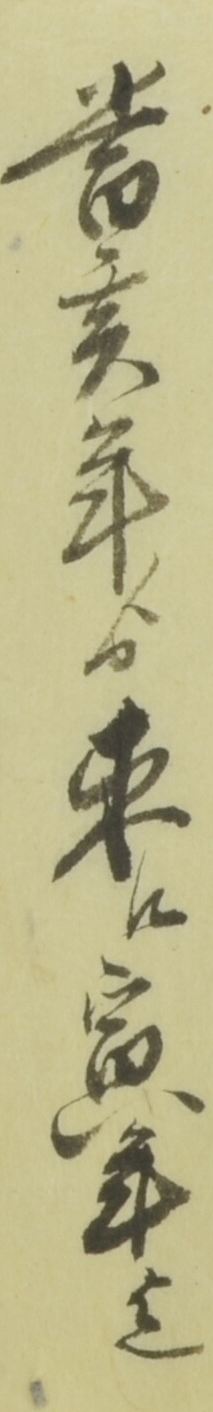当亥年ゟ来ル寅年迄
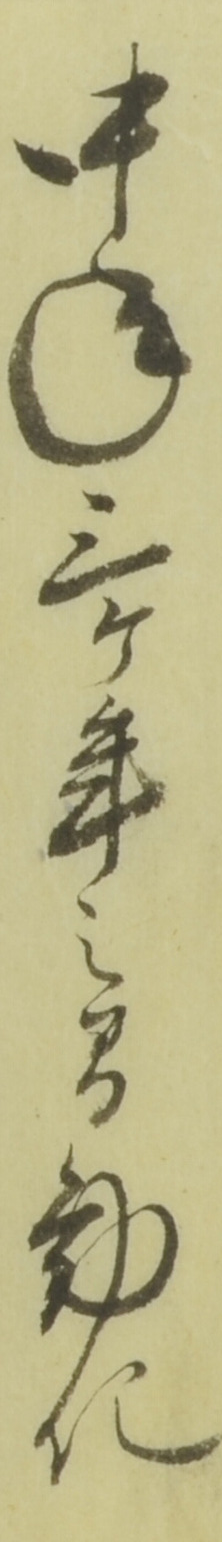中年三ヶ年之間勧化
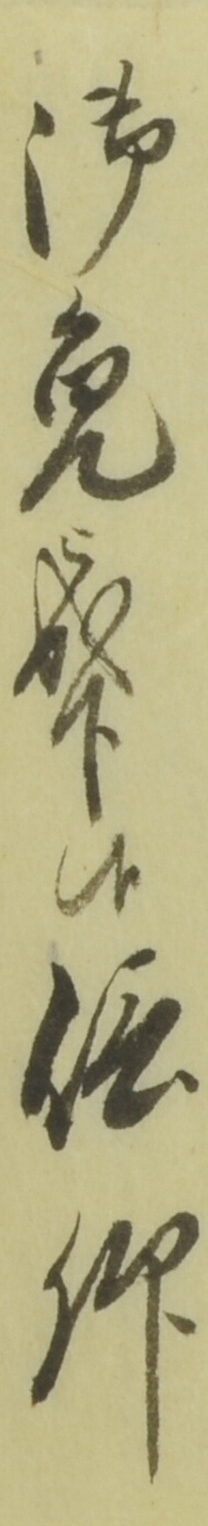御免被成下候信仰
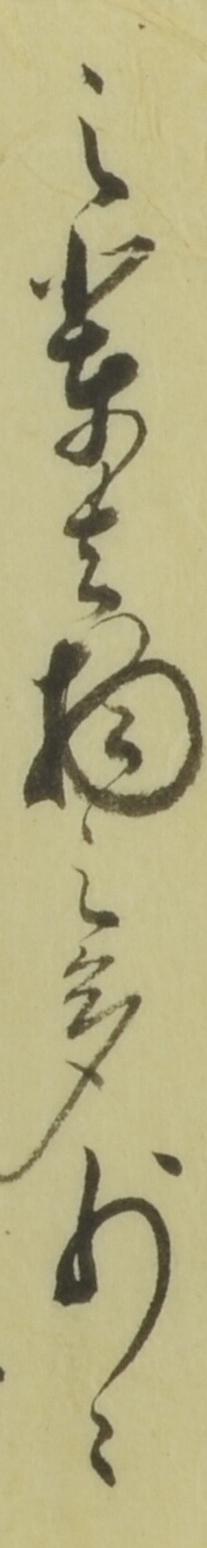之輩は物之多少ニ
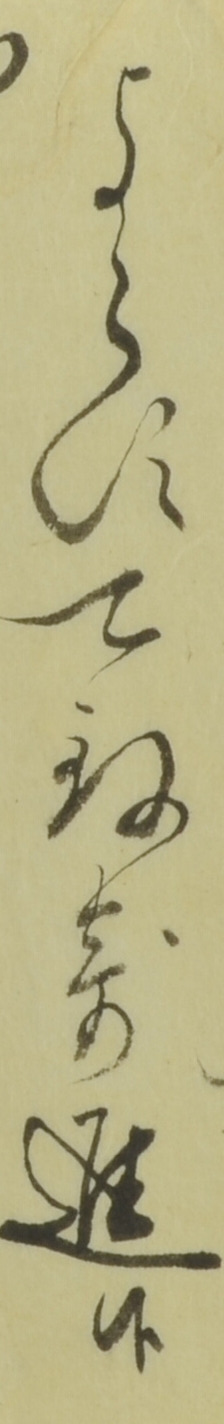よらす可致寄進候
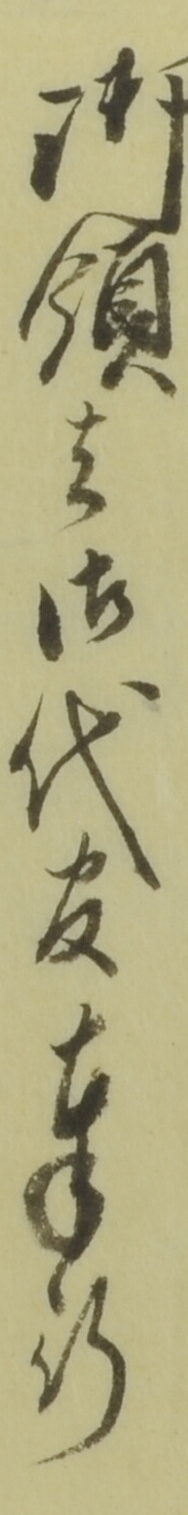御領は御代官奉行
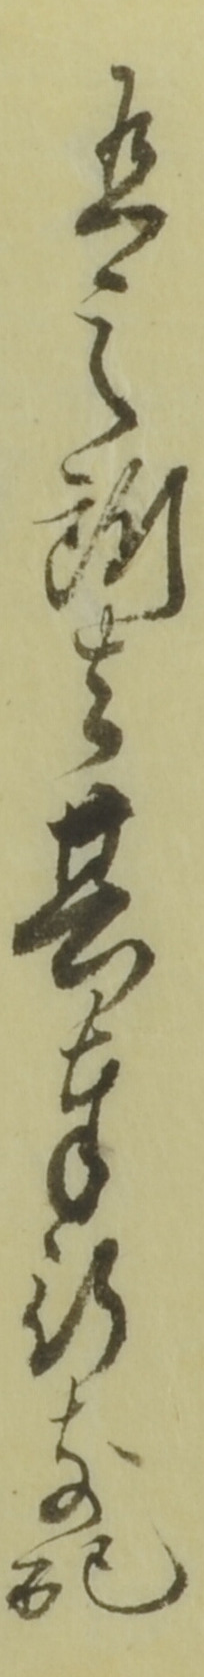有之所は其奉行支配
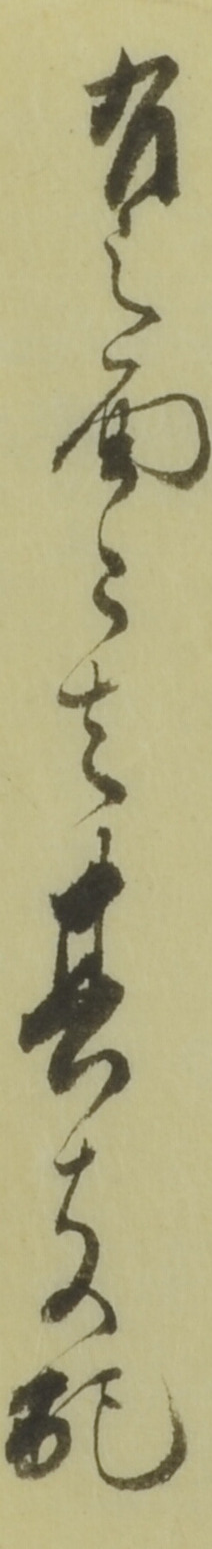有之面々は其支配
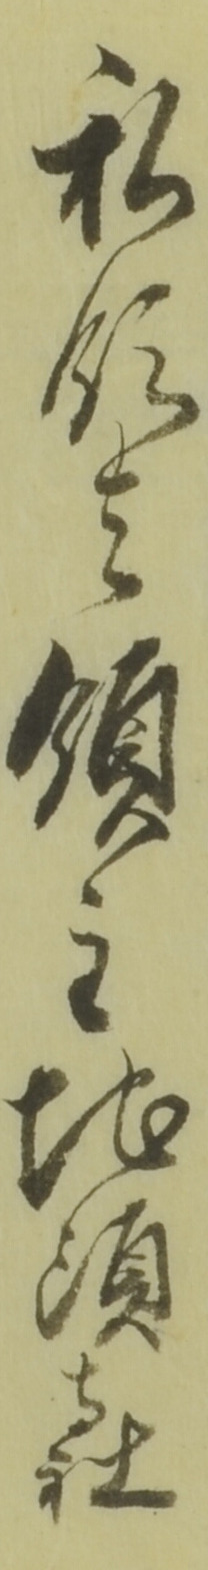私領は領主地頭寺社
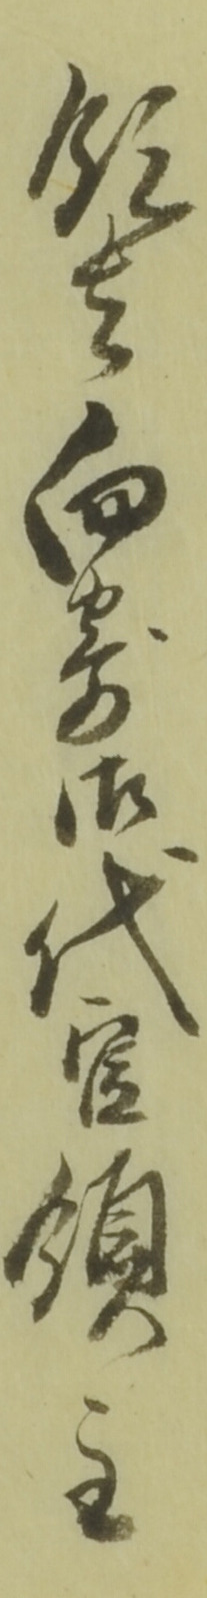領は向寄御代官領主
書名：御触書御書附控
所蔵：伊那市立高遠町図書館・合同会社AMANE
